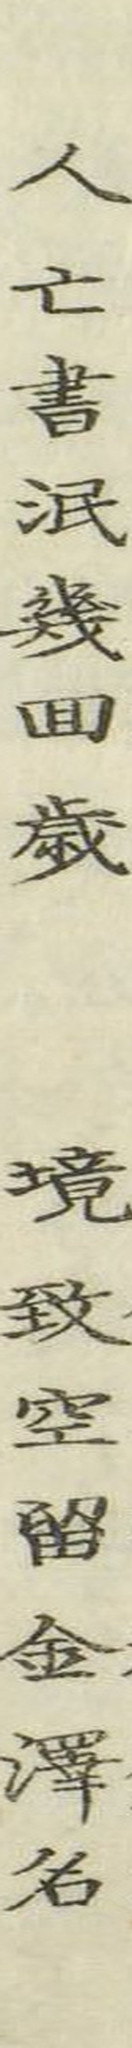人亡書泯幾囬歳境致空留金澤名
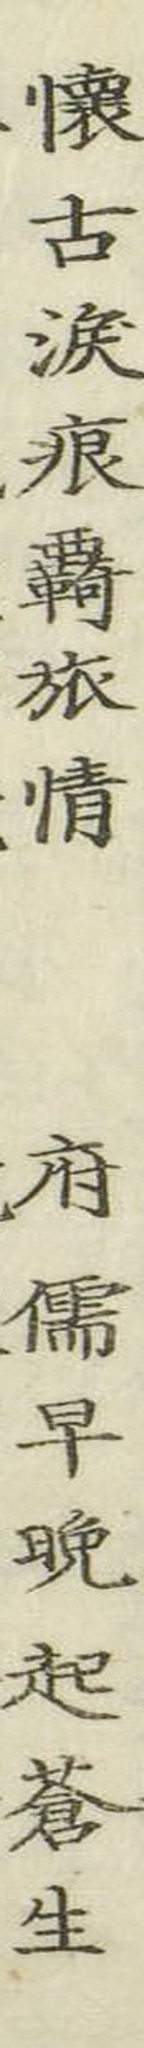懐古涙痕覉旅情府儒早晩起蒼生

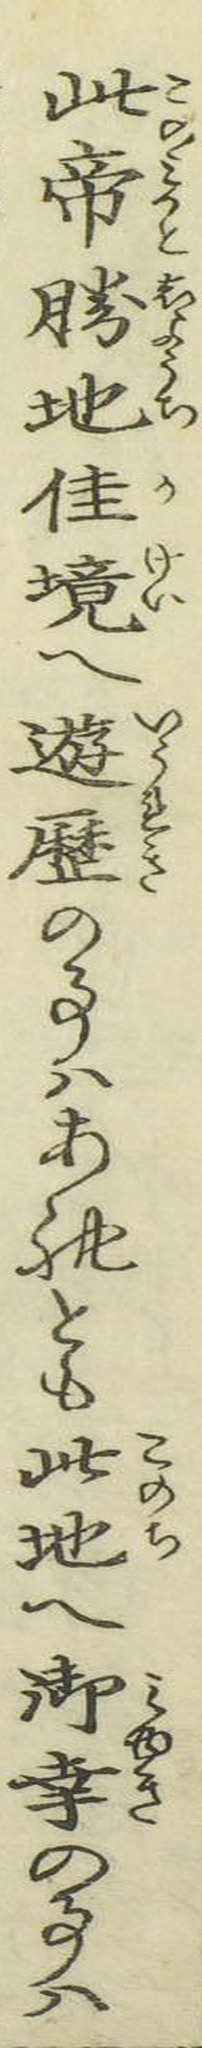此帝勝地佳境へ遊歷の事はあれとも此地へ御幸の事は
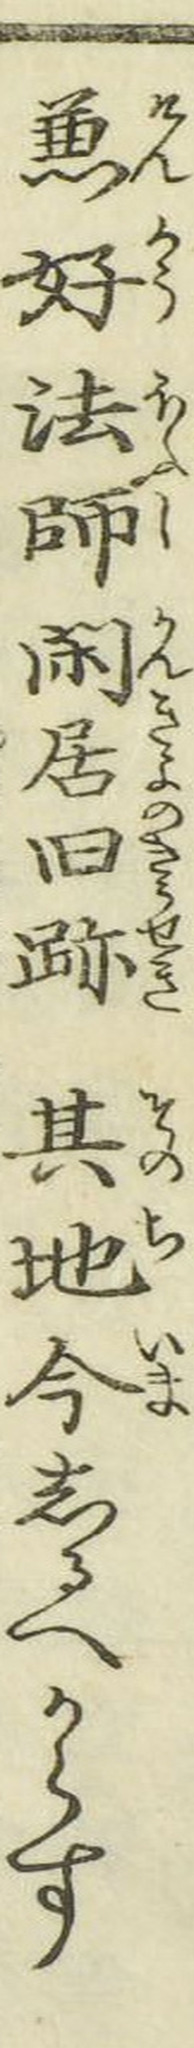兼好法師閑居旧跡其地今しるへからす
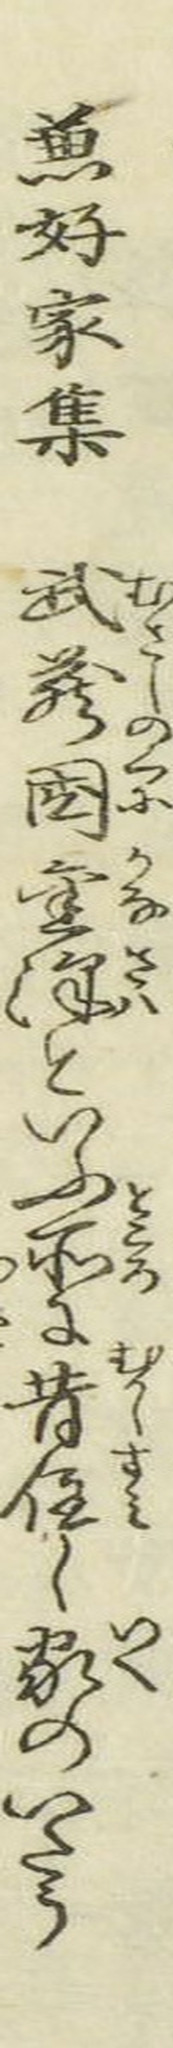兼好家集武蔵國金澤といふ所に昔住し家のいたう
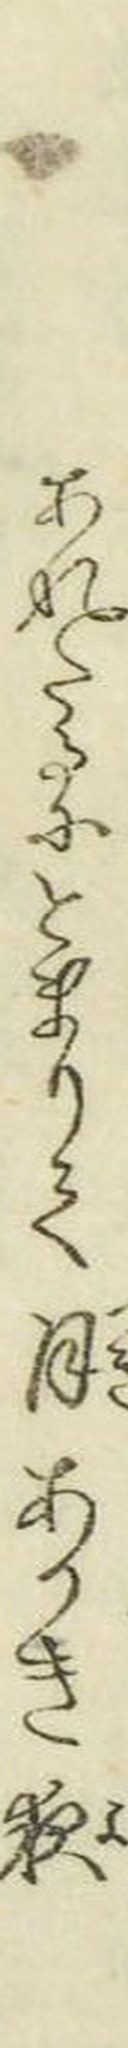あれたるにとまりて月あかき夜
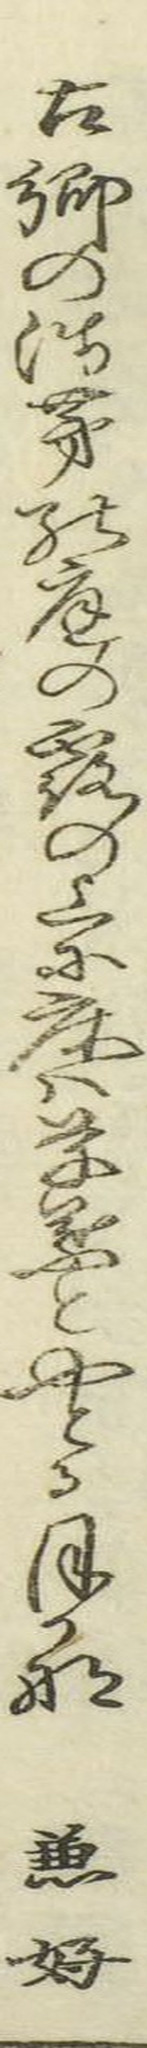古郷の浅茅の庭の露の上に床は草葉とやとる月かな兼好
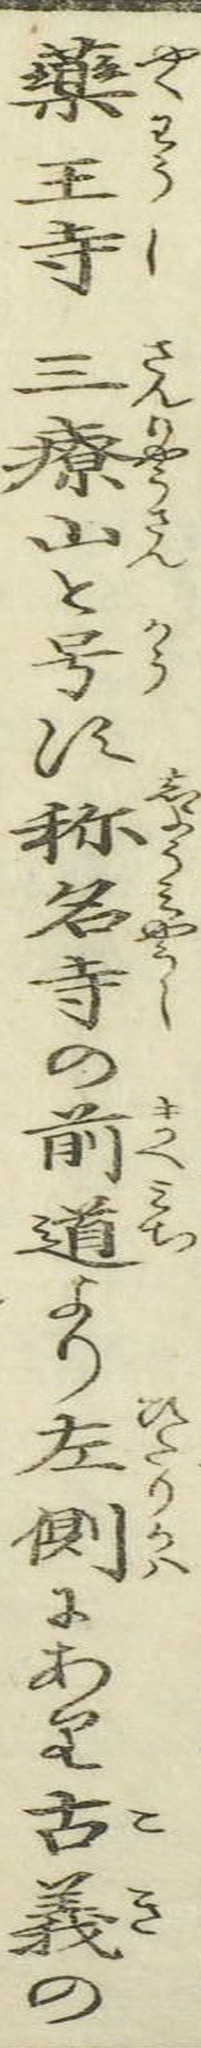藥王寺三療山と号す称名寺の前道より左側にあり古義の
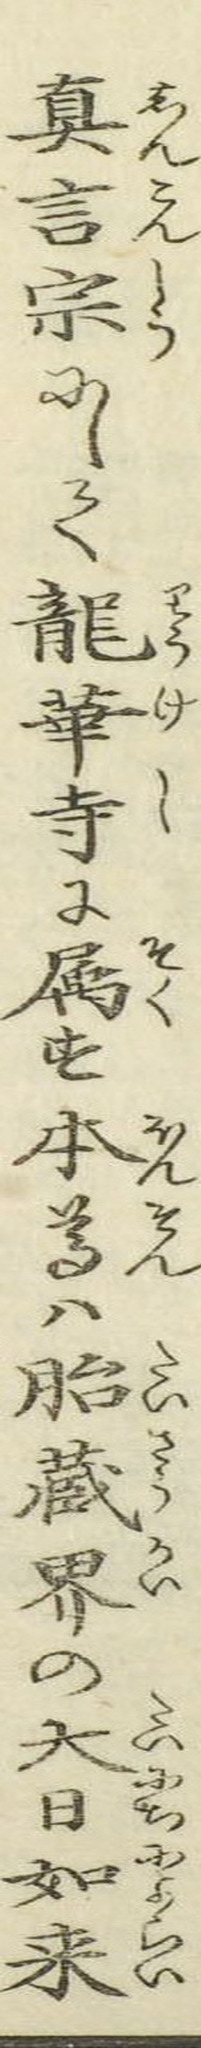真言宗にして龍華寺に属す本尊は胎蔵界の大日如来
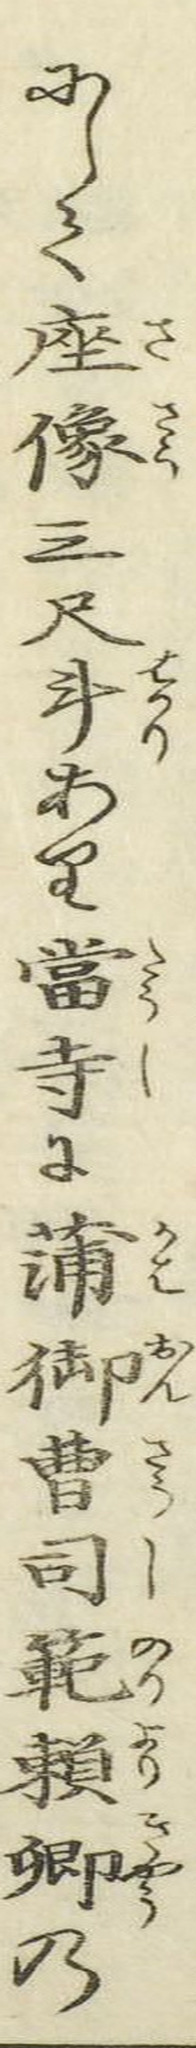にして座像三尺斗あり當寺に蒲御曹司範頼卿の
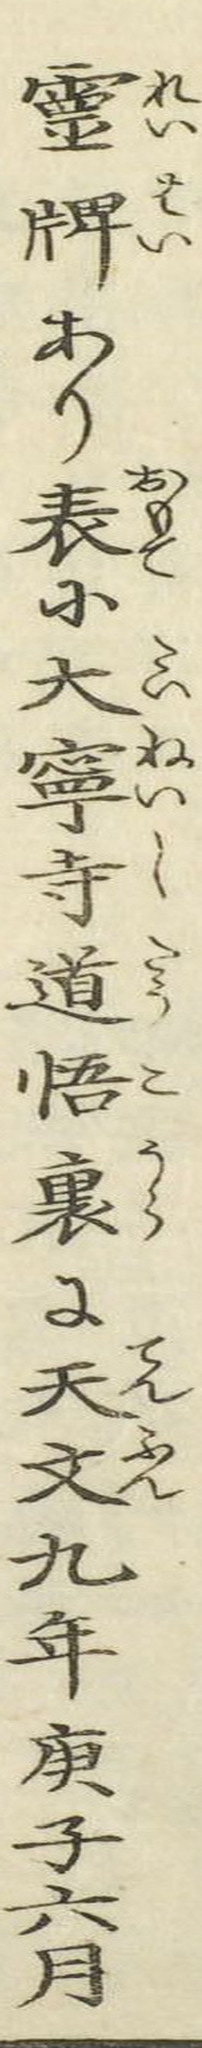霊牌あり表に大寧寺道悟裏に天文九年庚子六月
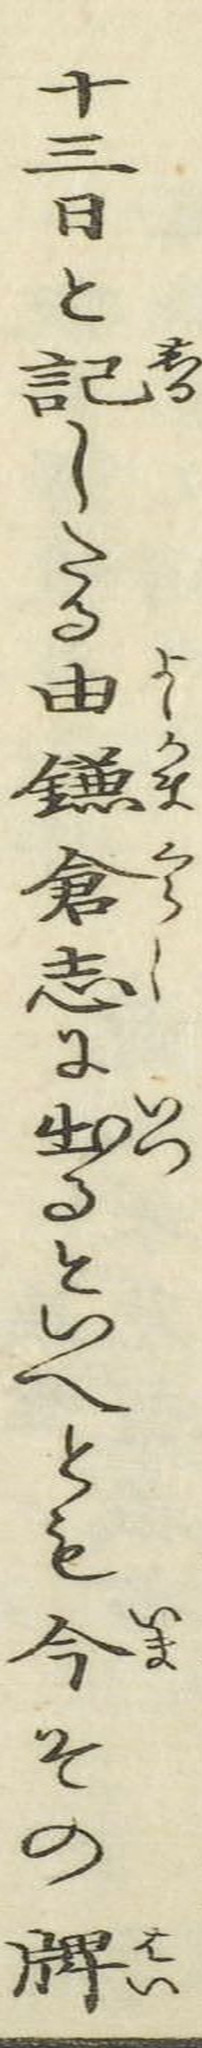十三日と記したる由鎌倉志に出るといへとも今その牌
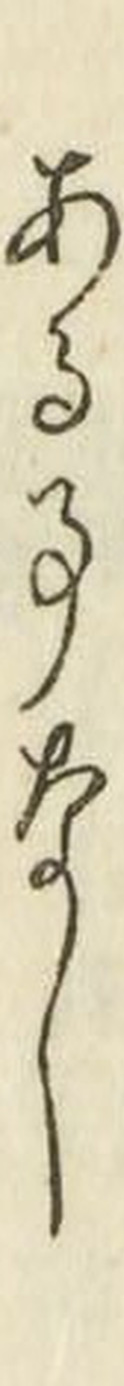ある事なし
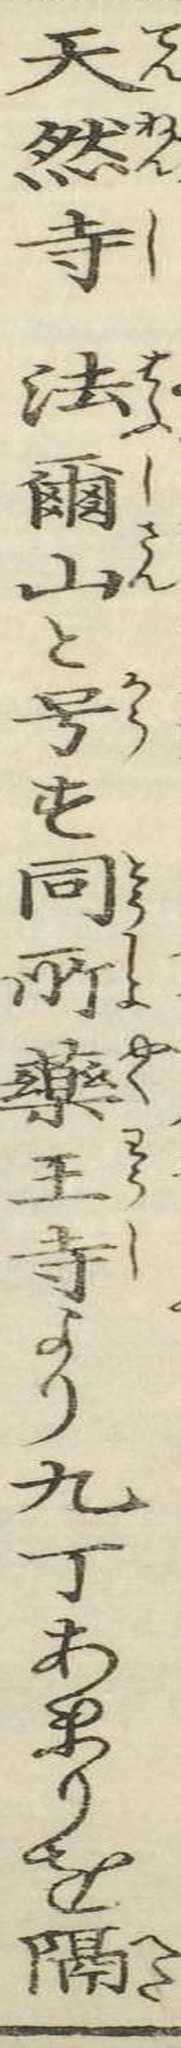天然寺法爾山と号す同所藥王寺より九丁あまりを隔
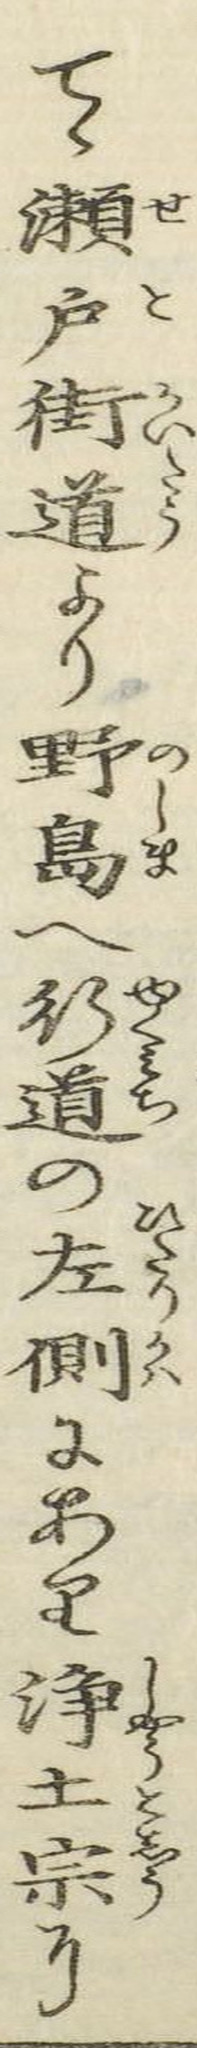てゝ瀬戸街道より野島へ行道の左側にあり浄土宗に
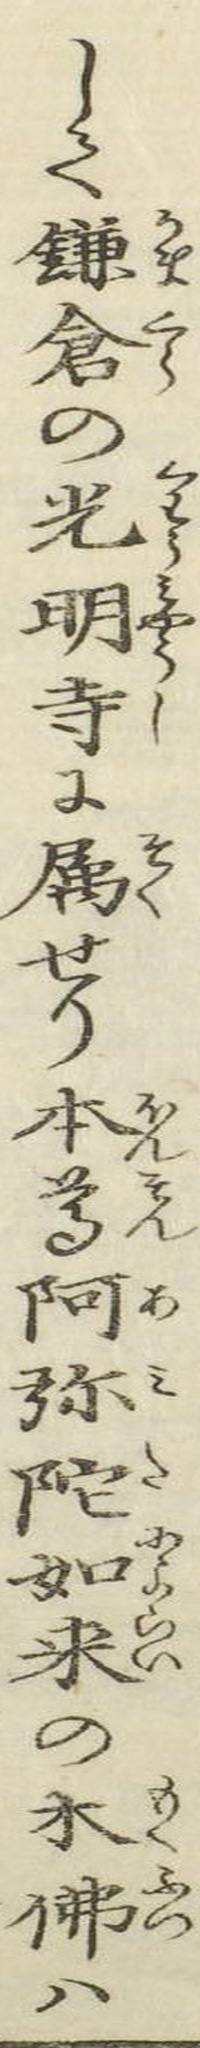して鎌倉の光明寺に属せり本尊阿弥陀如来の木佛は
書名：江戸名所図会 20巻 巻之6
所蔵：東京学芸大学教育コンテンツアーカイブ
